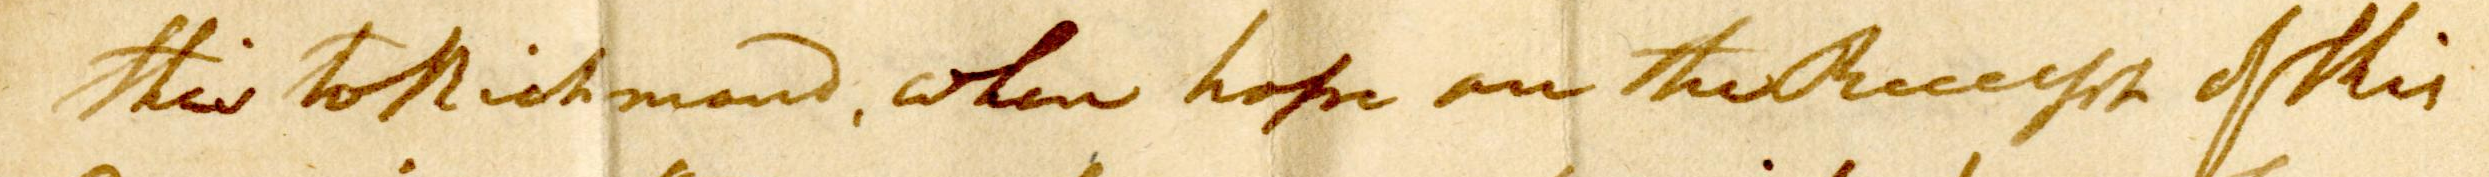this to Richmond, when hope are the Receipt of this
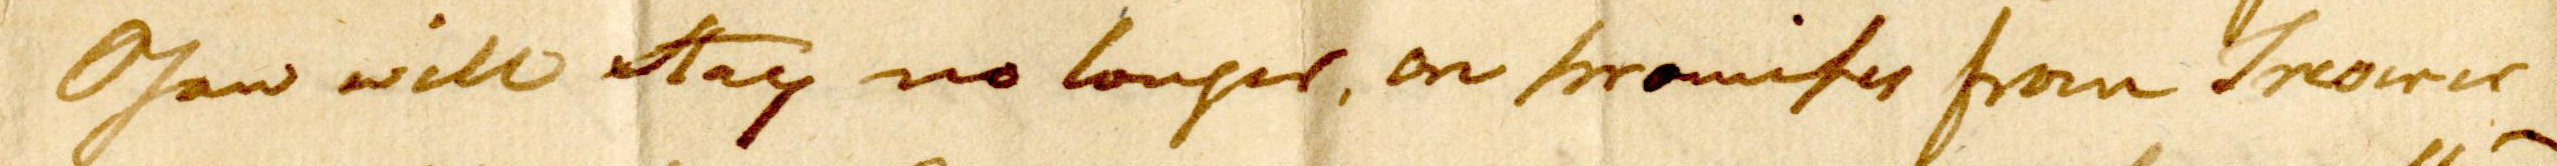you will stay no longer on promises from Troerer
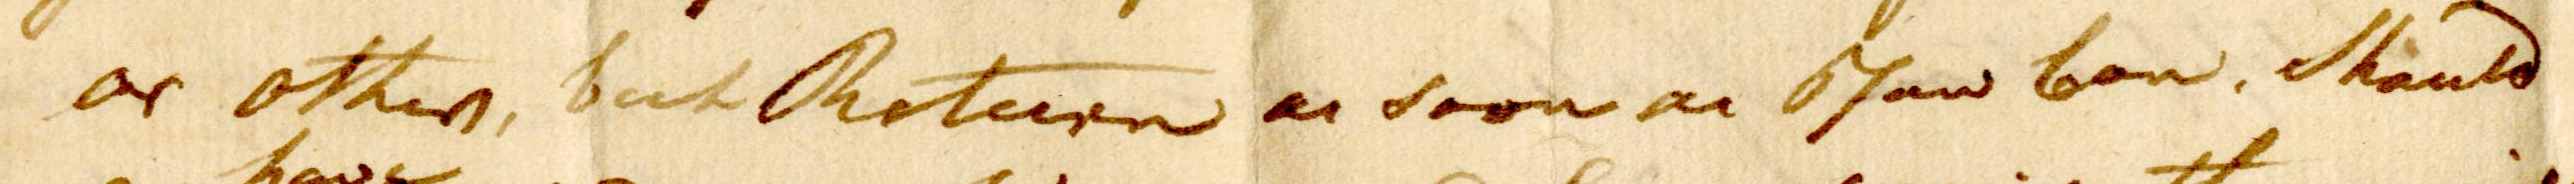or other, but Return as soon as you can. Should
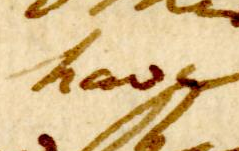have
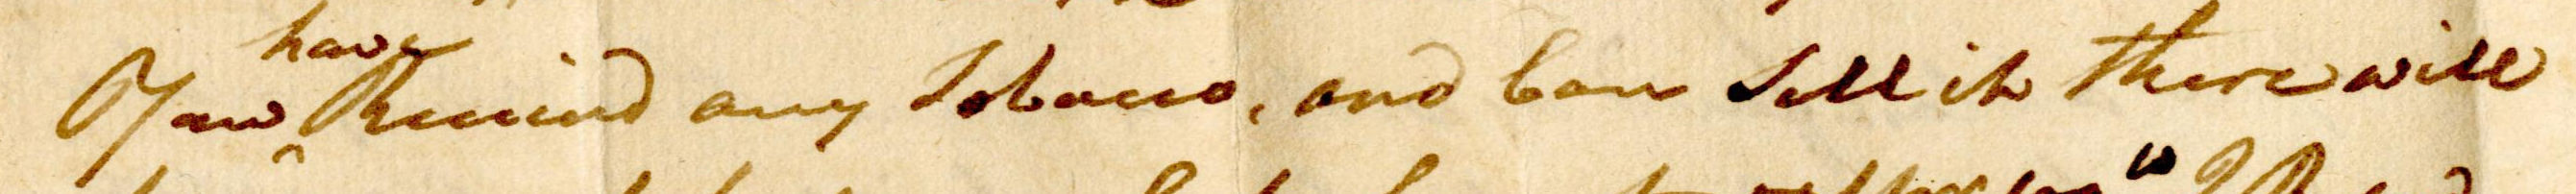you ^ Received any Tobacco, and Can sell it there will
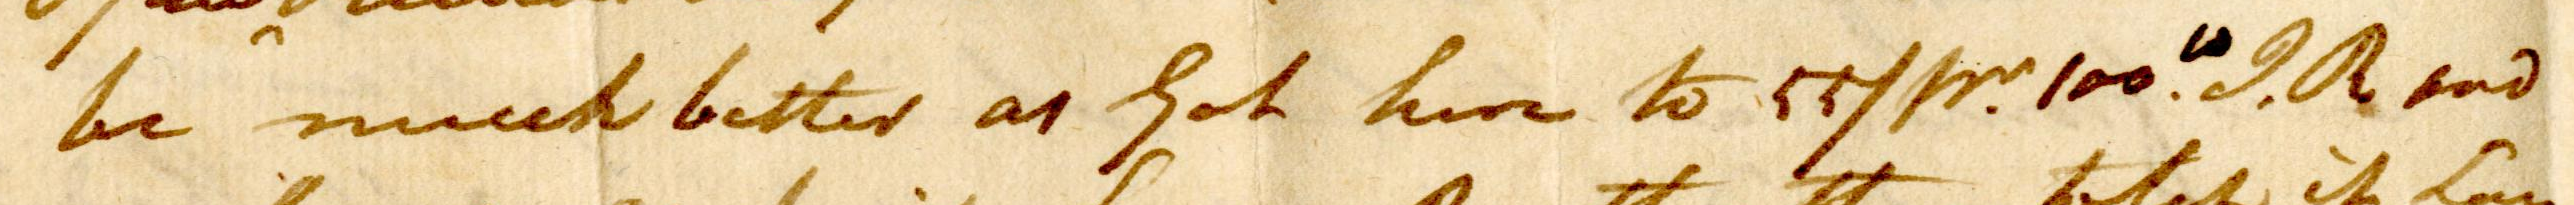be much better as Got here to 55s p^r. 100^a. J. R and
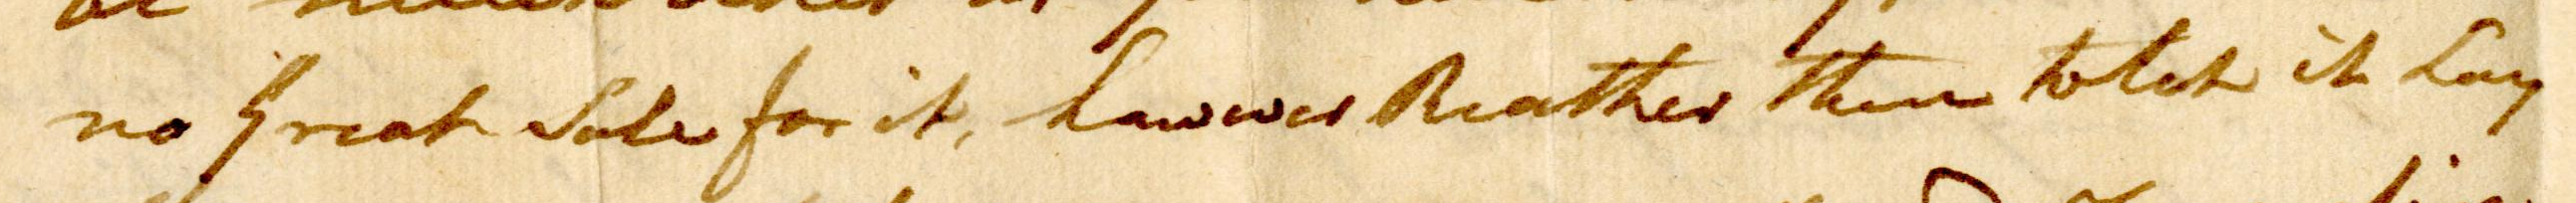no Great sale for it, however Reather there to let it Lay
